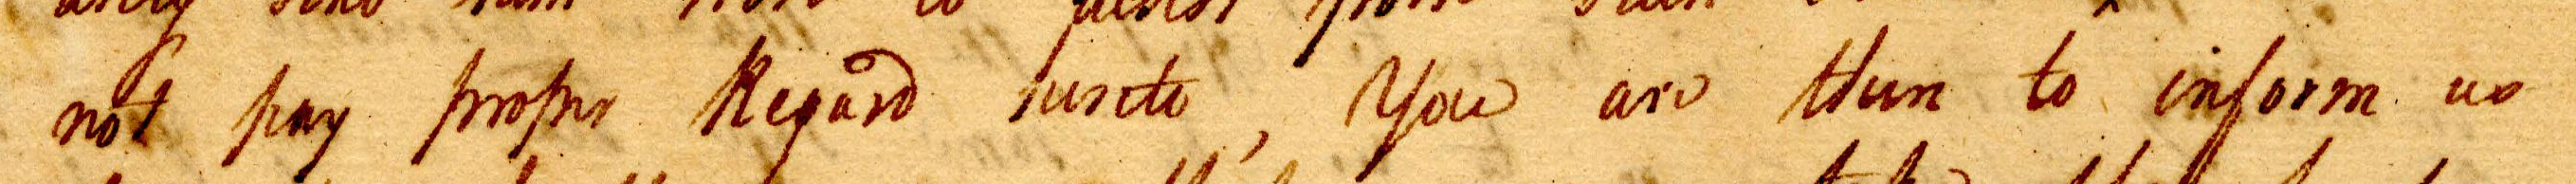not pay proper Regard unto, You are then to inform us
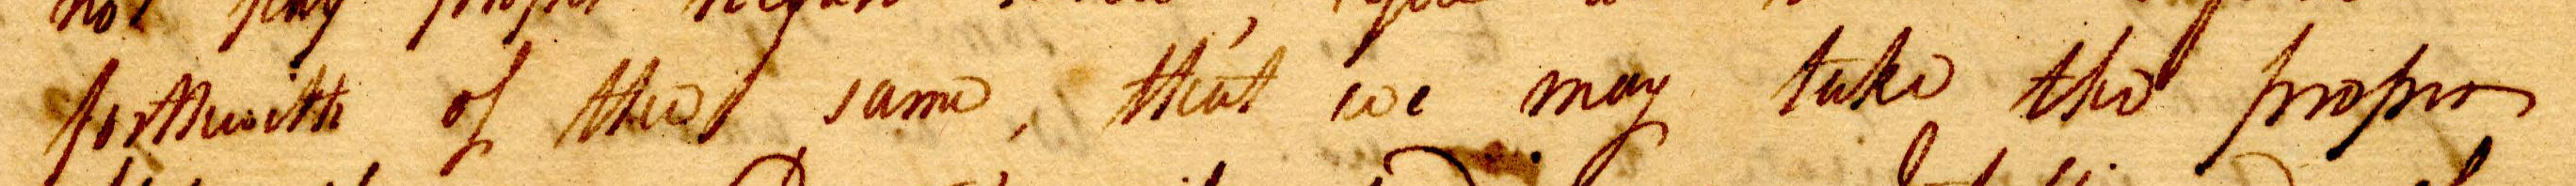forthwith of the same, that we may take the proper
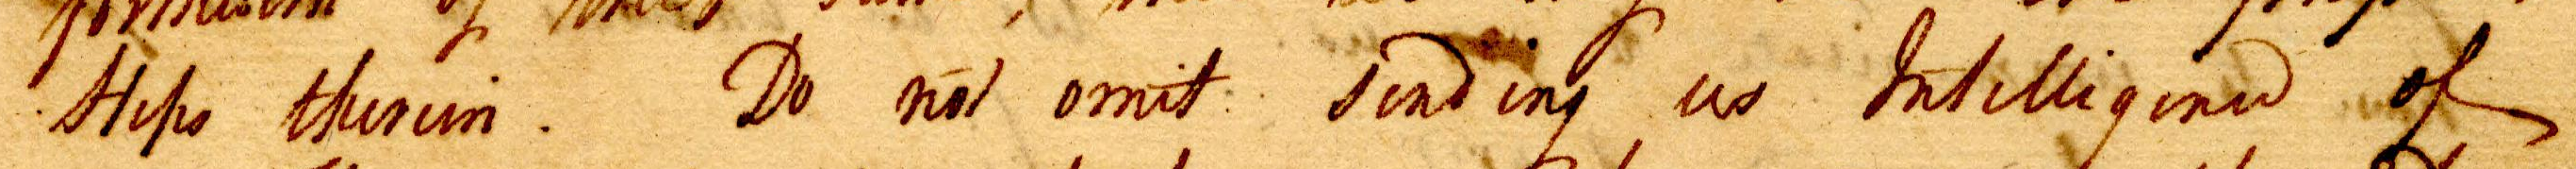steps therein. Do not omit sending us Intelligence of
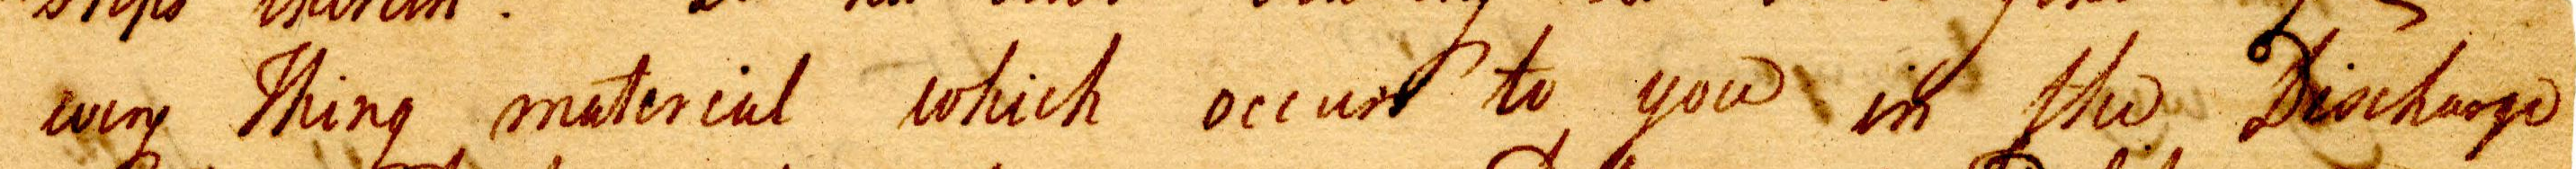every Thing material which occurs to you in the Discharge
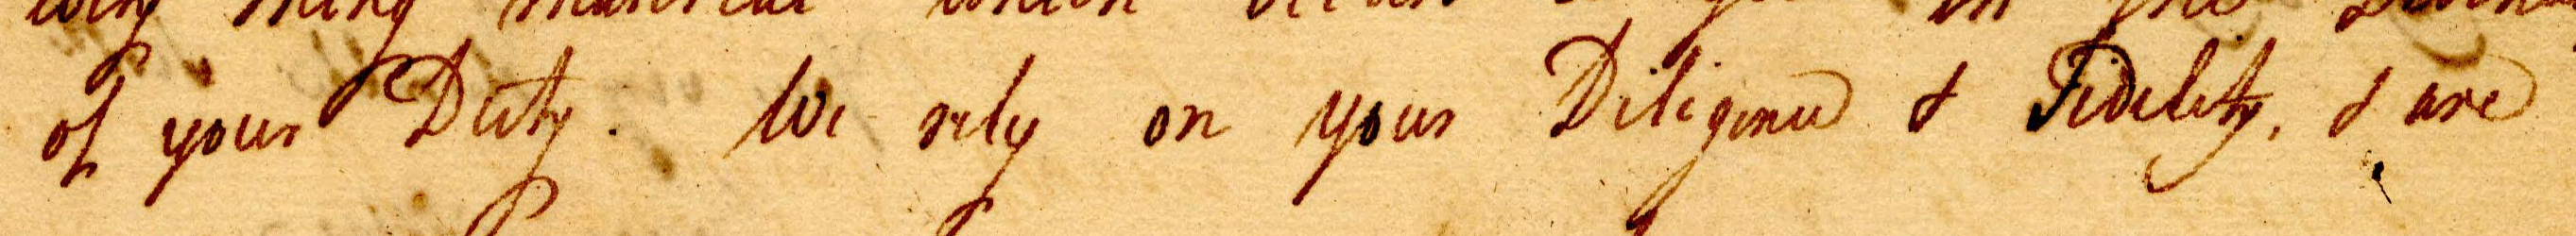of your Duty. We rely on your Diligence & Fidelity, & are
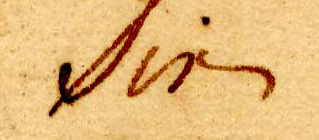Sir
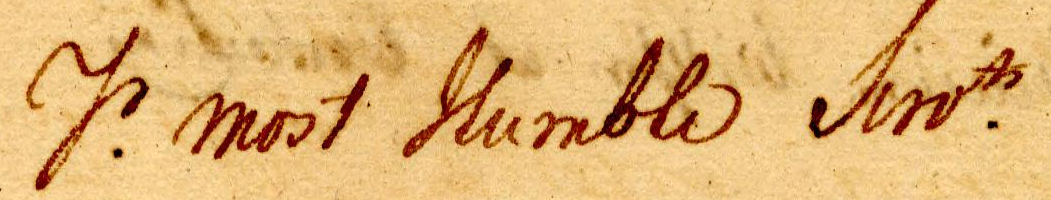Y^r. most Humble Serv^ts.
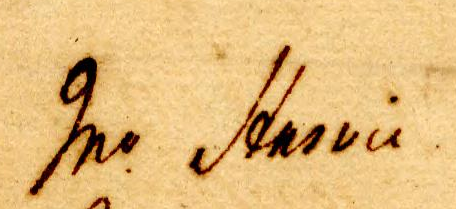M^r Harvie
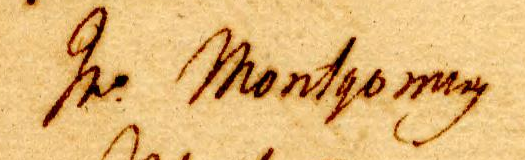M^r Montgomery
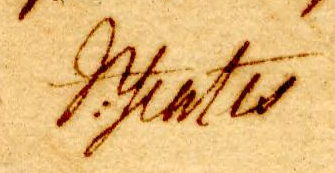J. Yeates
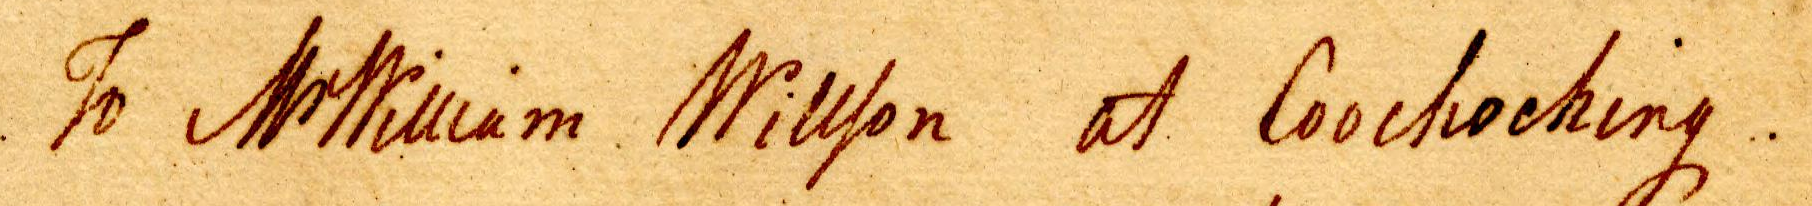To M^r William Wilson at Coochocking.
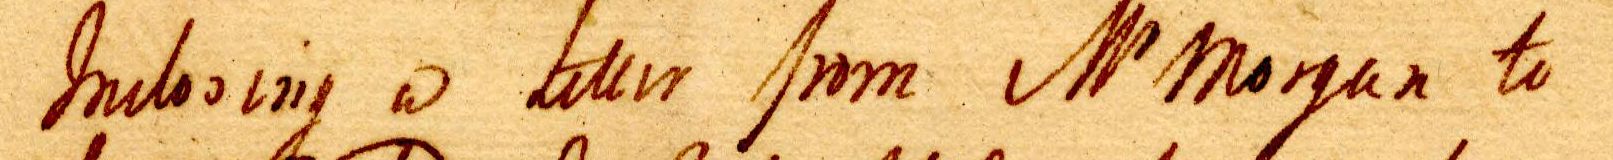Inclosing a Letter from M^r Morgan to
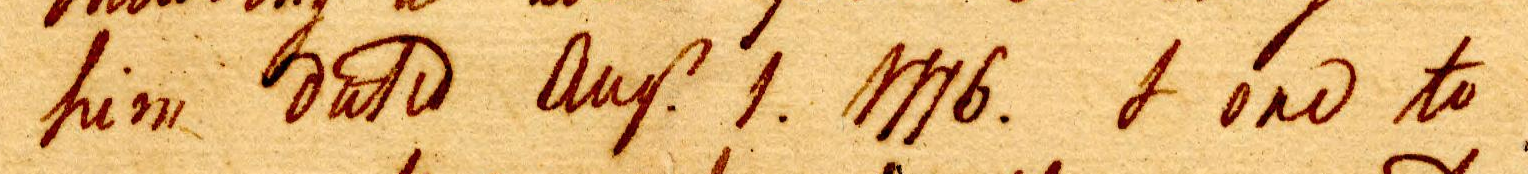him dated Aug. 1. 1776. & one to
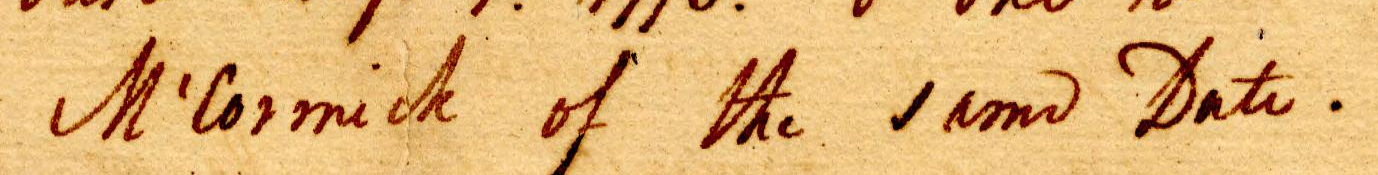M^cCormick of the same Date.
